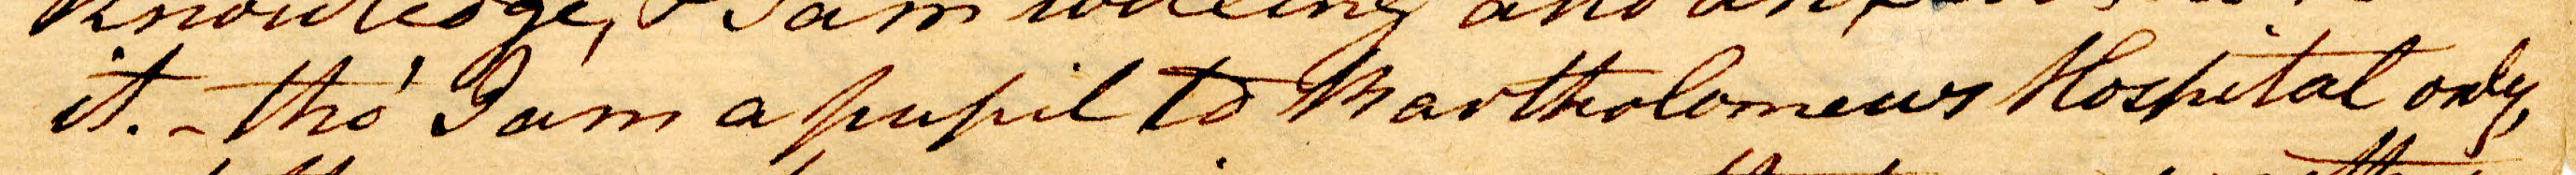it.- tho' I am a pupil to Bartholomews Hospital only,
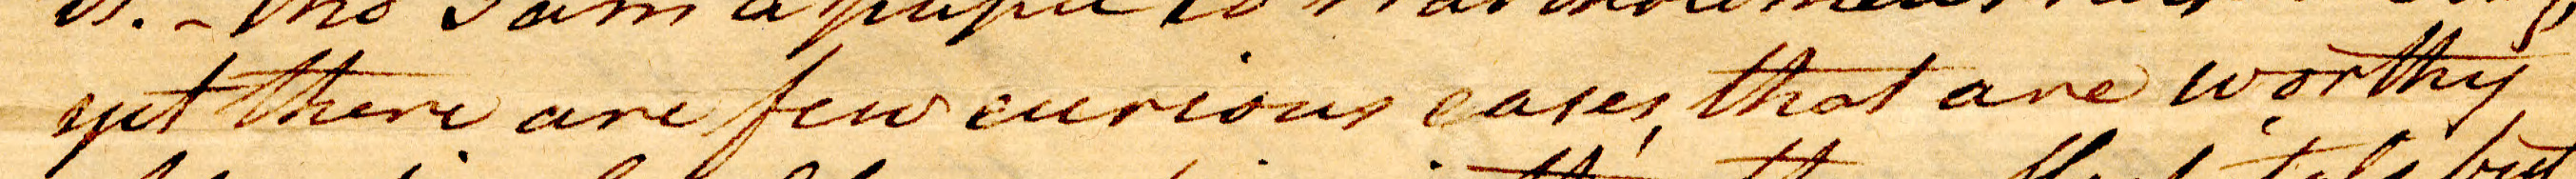yet there are few curious cases that are worthy
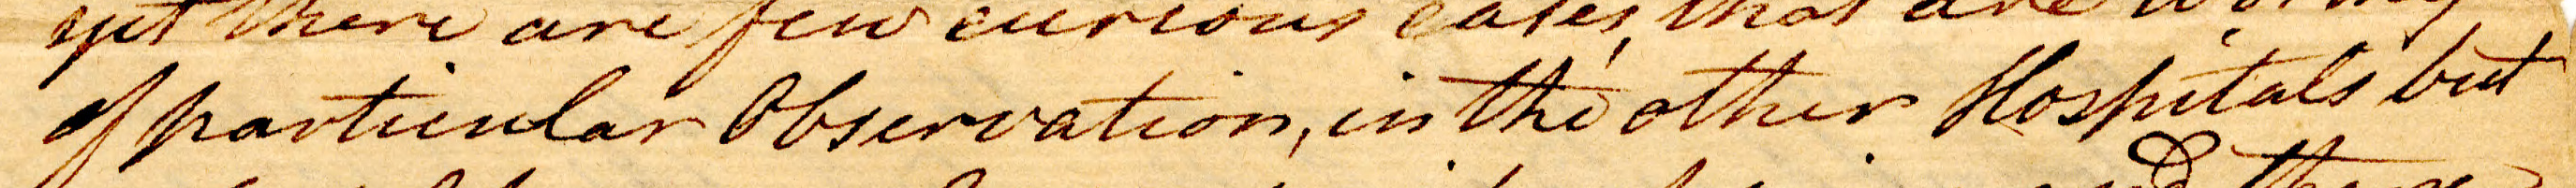of particular Observation, in the other Hospitals but
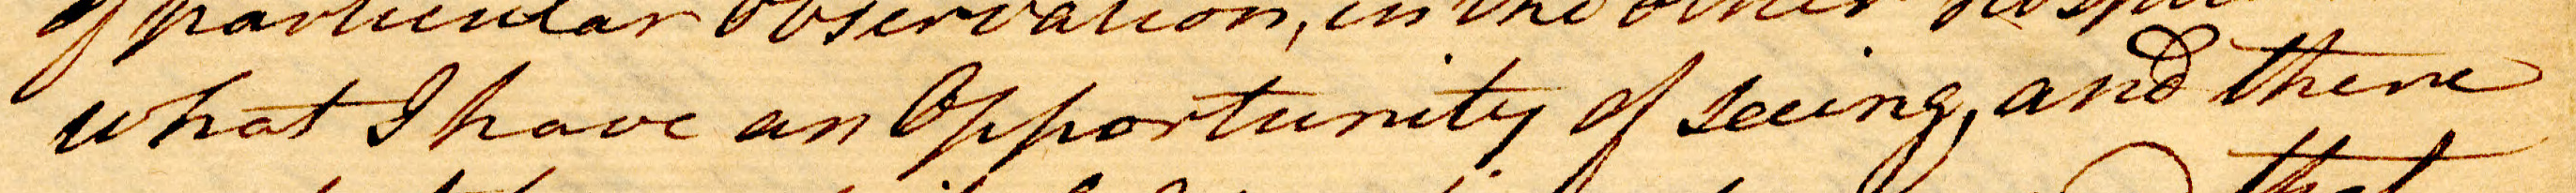what I have an Opportunity of seeing, and there
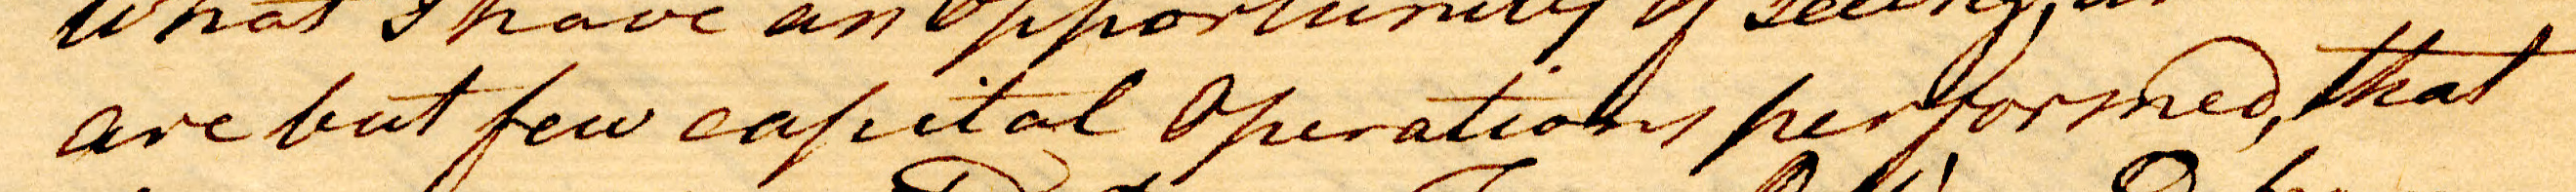are but few capital Operations performed, that
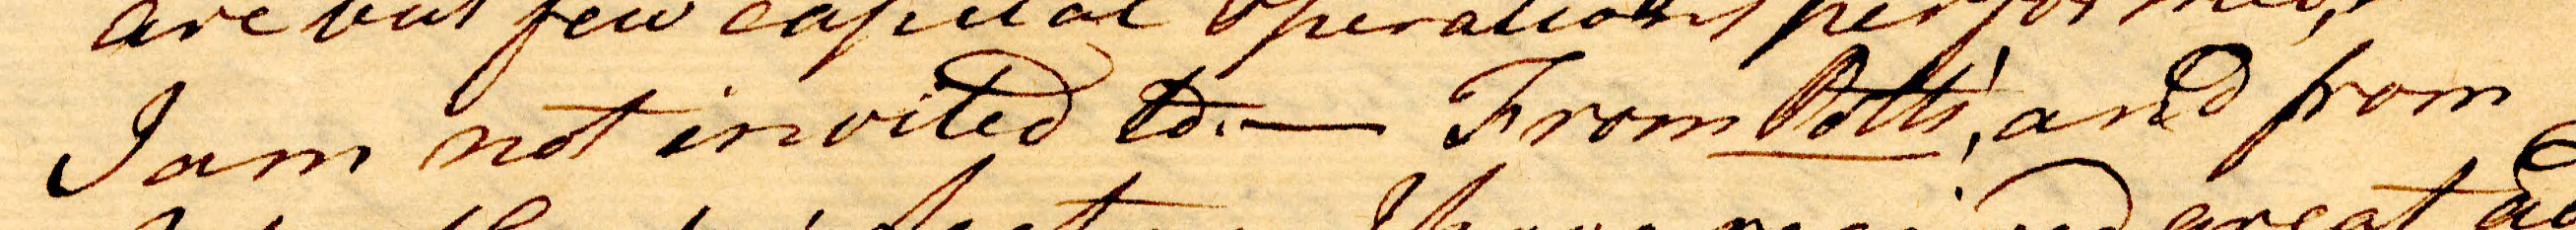I am not invited to- From Potts', and from
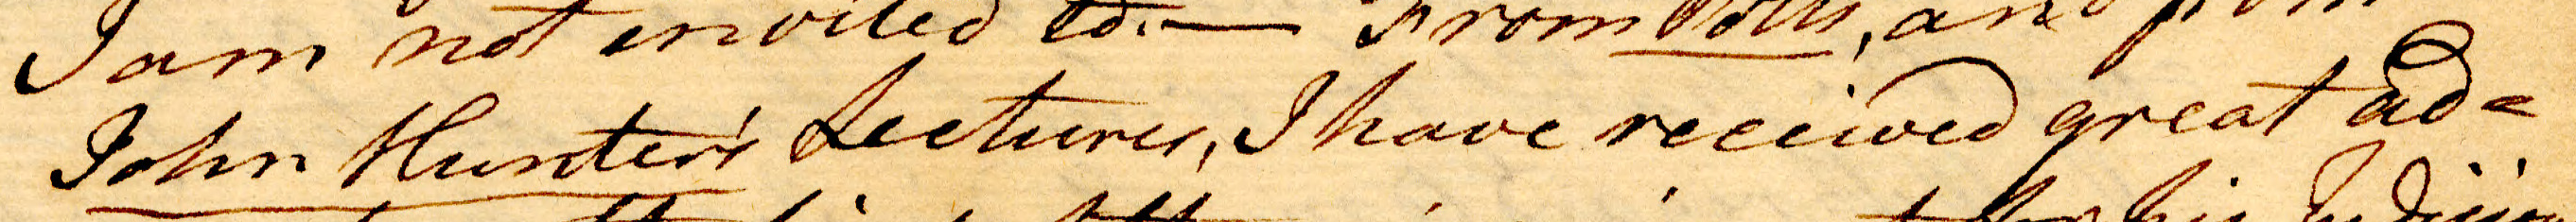John Hunters' Lectures, I have received great ad-
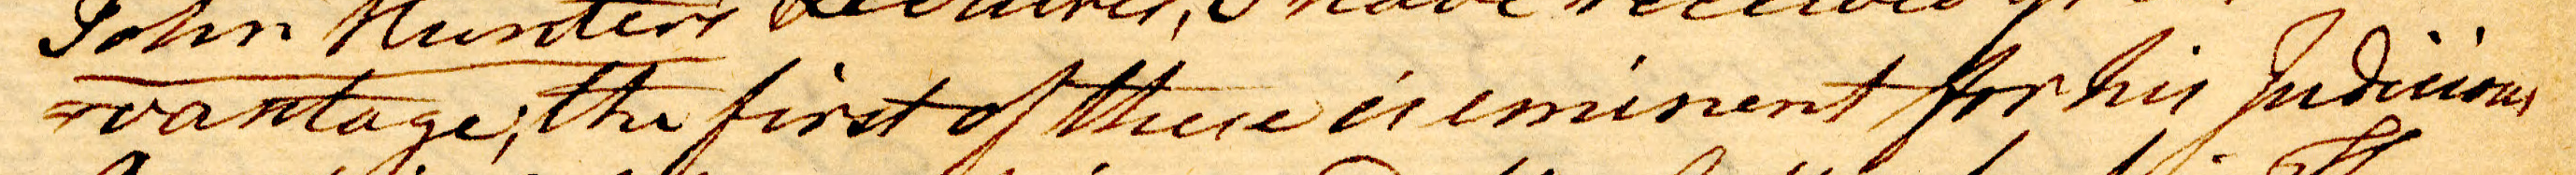-vantage; the first of these is eminent for his Judicious
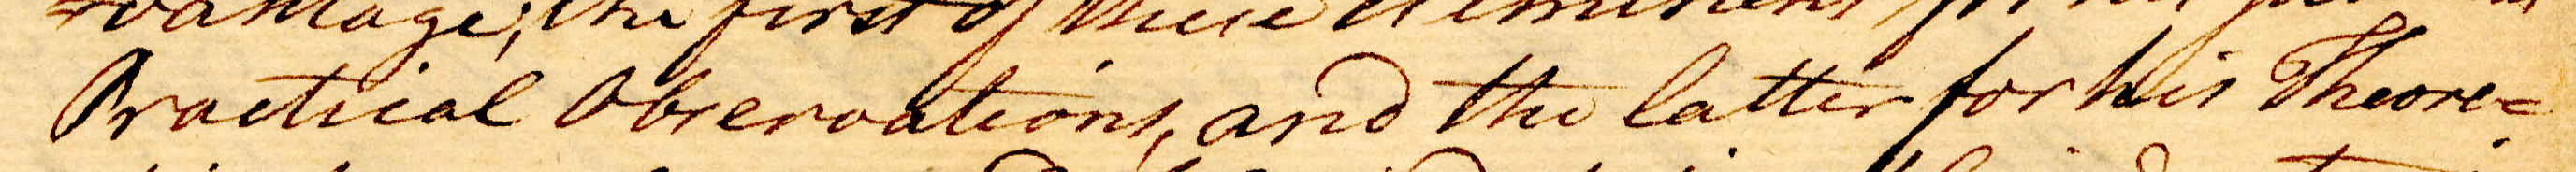Practical Observations, and the latter for his Theore-
